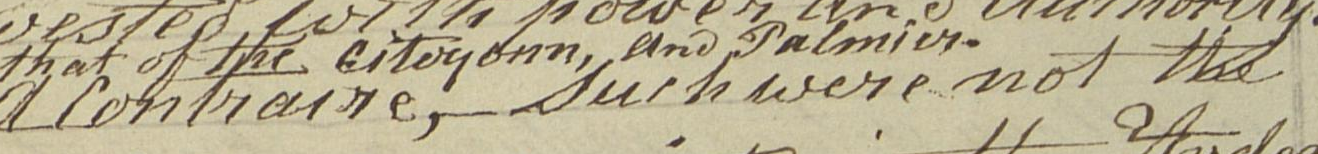A Contraire, such were not the
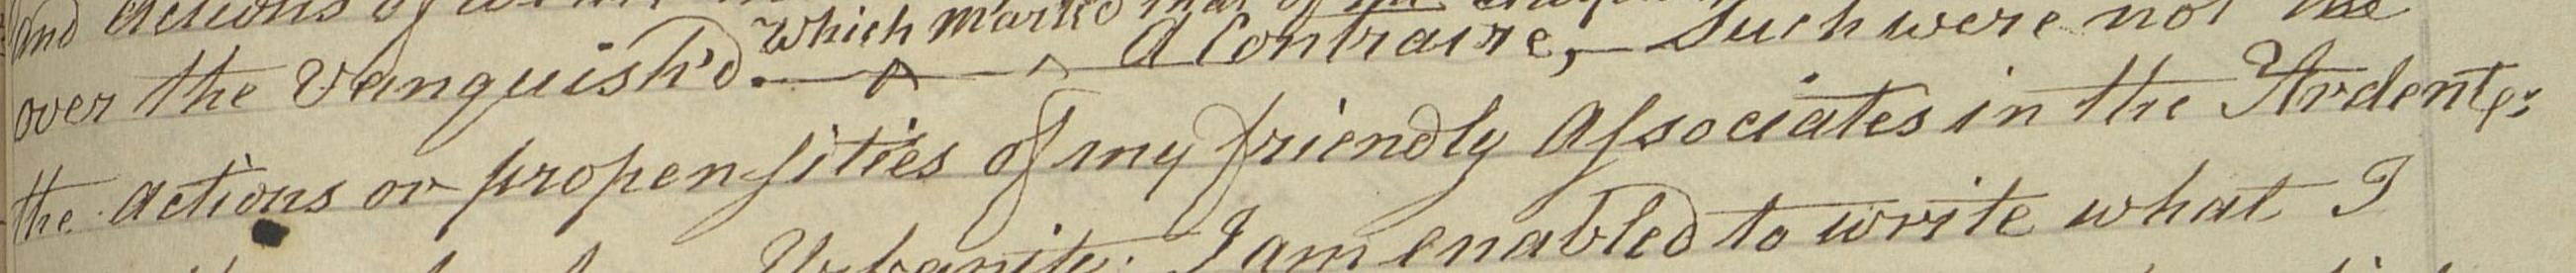the actions or propensities of my friendly associates in the Ardent:
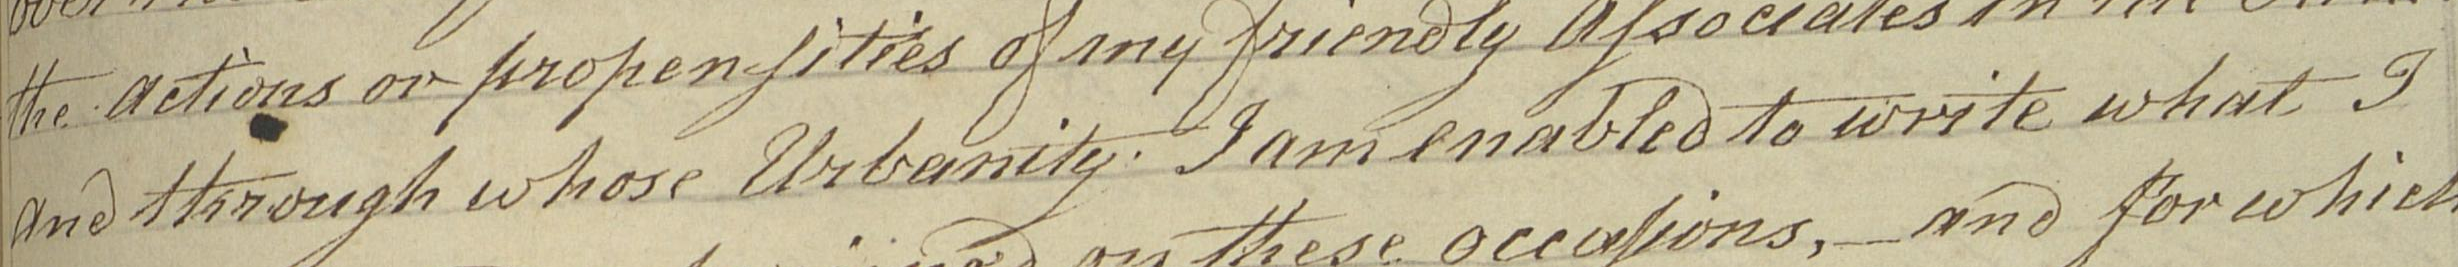and through whose Urbanity. I am enabled to write what I
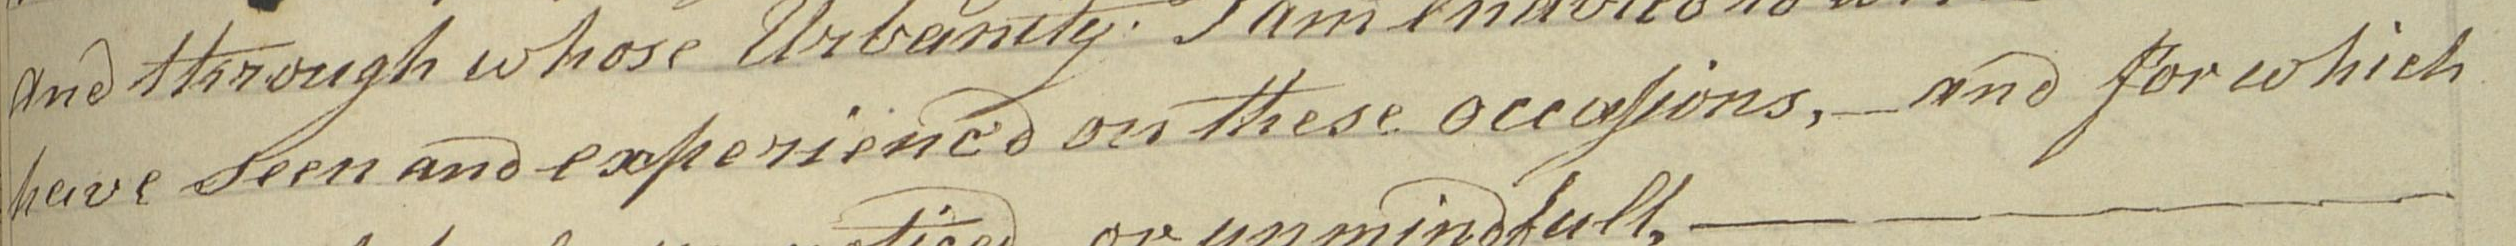have seen and experienc'd on these occasions, and for which
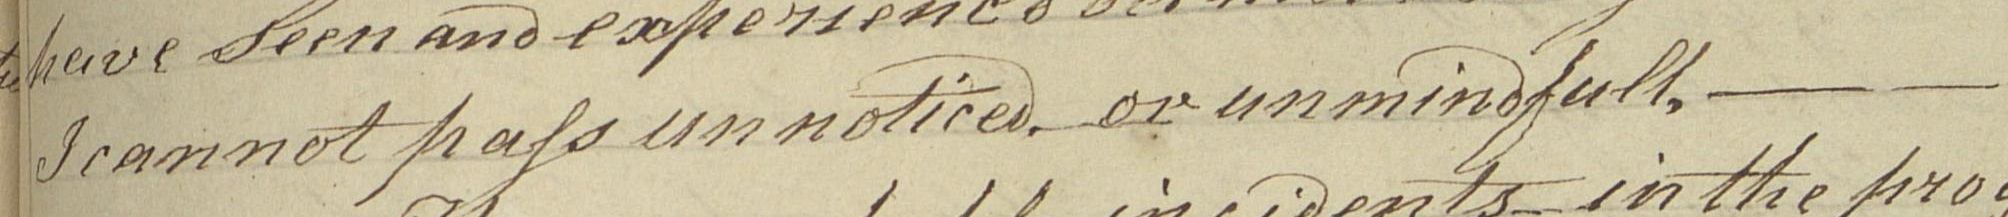I cannot pass unnoticed, or unmindfull.
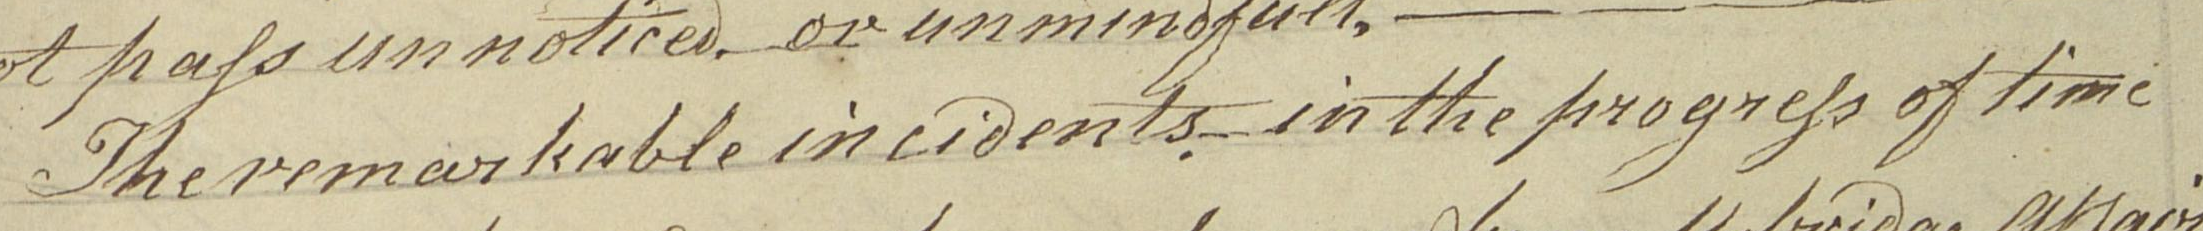The remarkable incidents in the progress of time
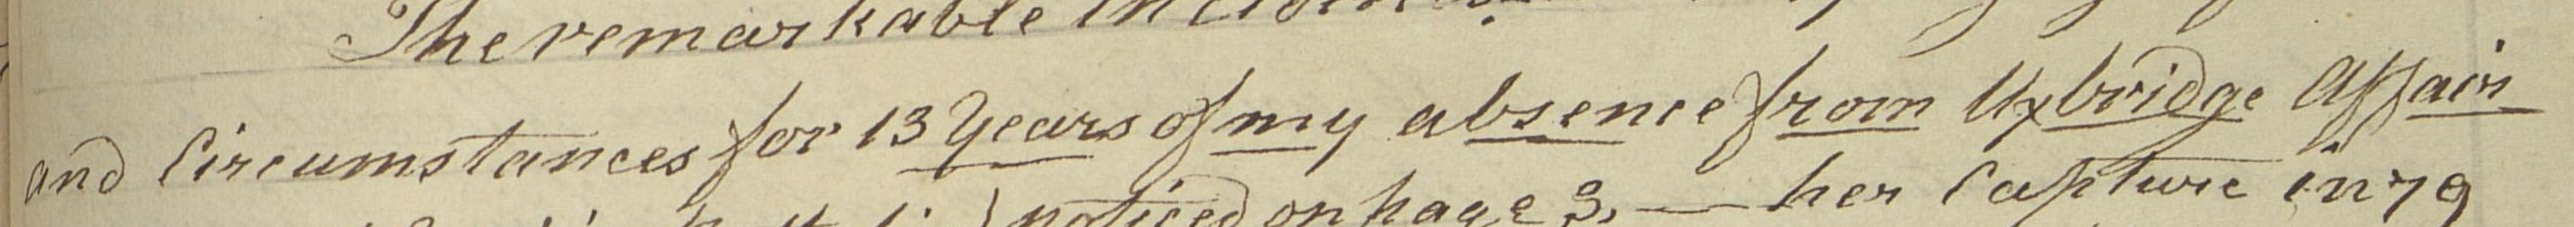and Circumstances for 13 Years of my absence from Uxbridge Affair
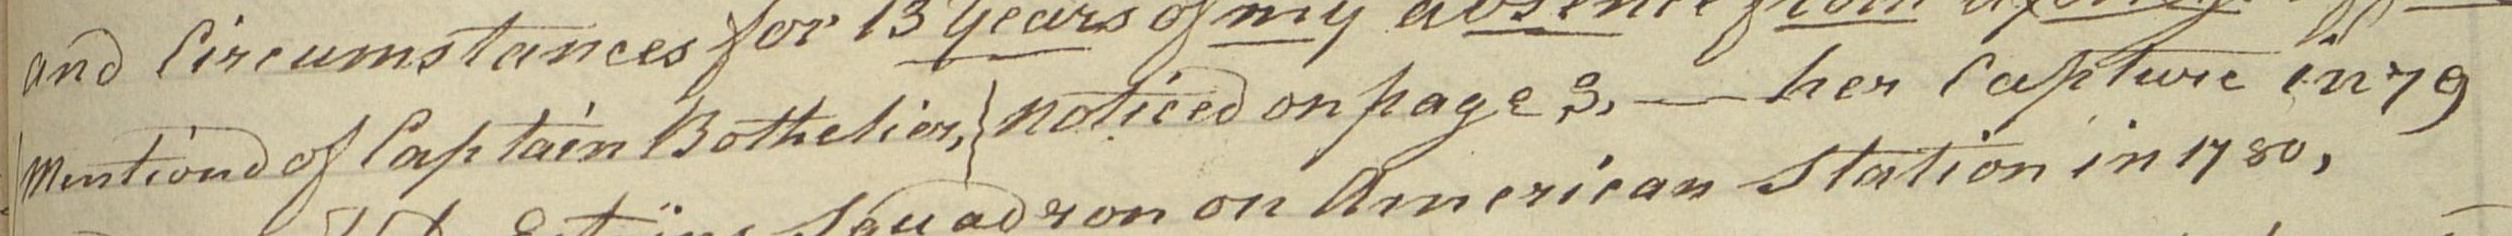mentiond of Captain Bothelier, Noticed on page 3, her Capture in 79
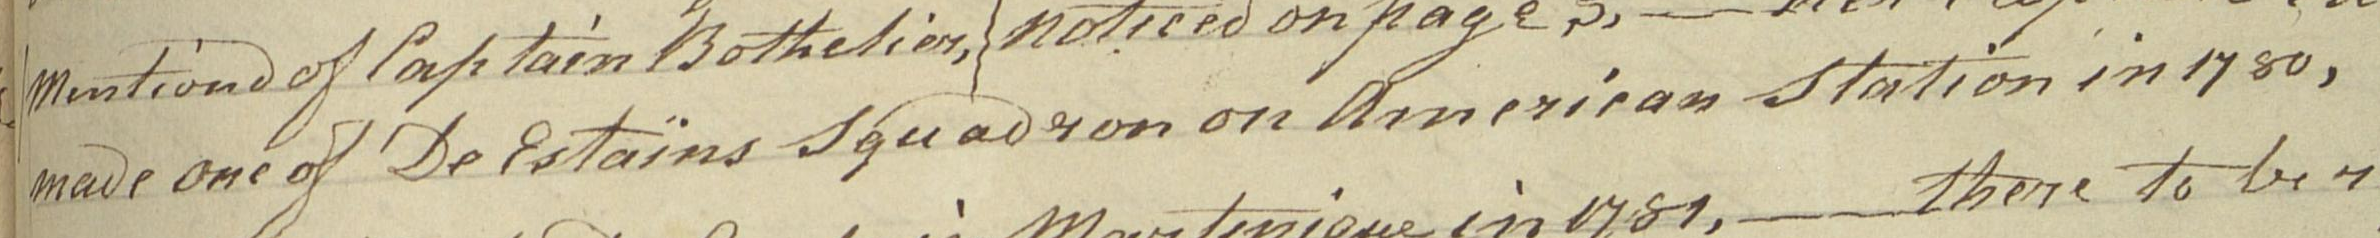made one of De Estains Squadron on American Station in 1780,
